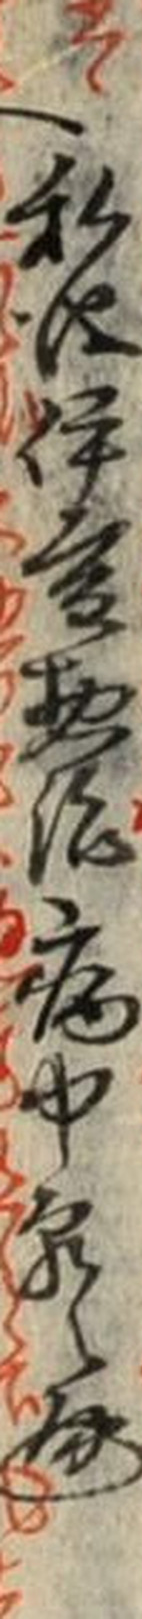私儀伊藤惣治病中願之通
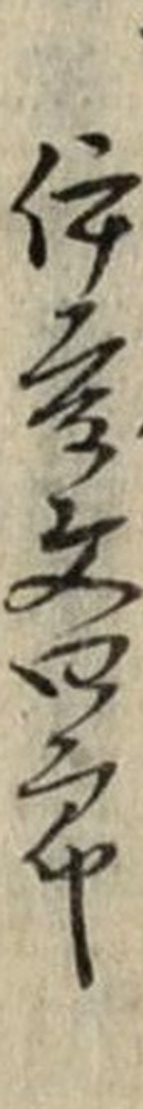伊藤文四郎
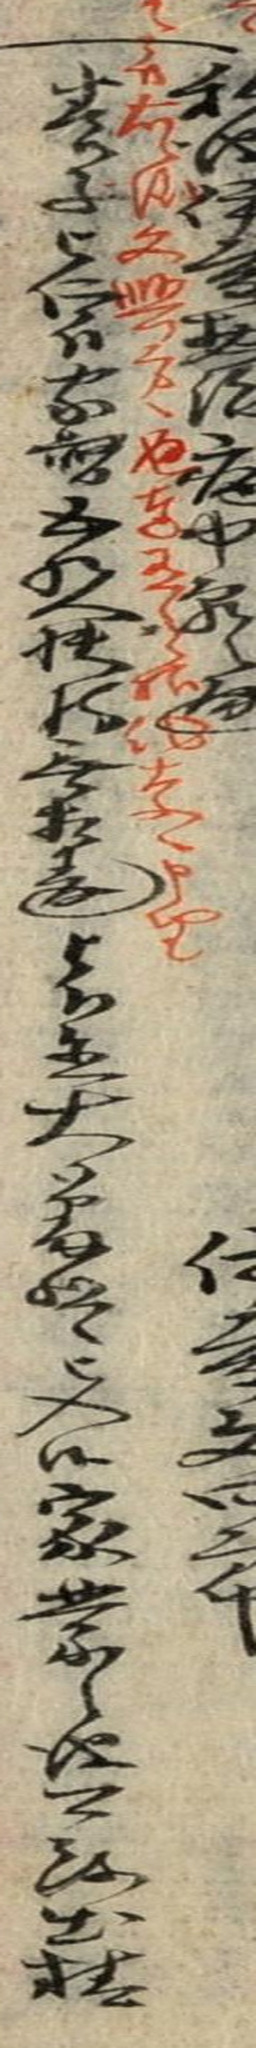養子被仰付家督五拾人扶持無相違被下置大御番組へ被入候家業之儀可致出精
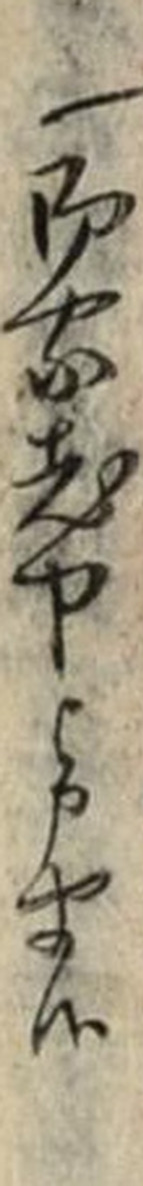御家老中被申聞候
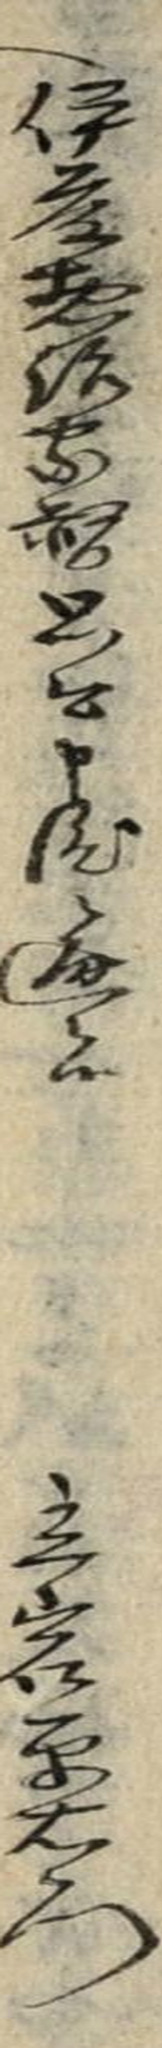伊藤惣治家督只今申渡候通に候立岩平右衛門
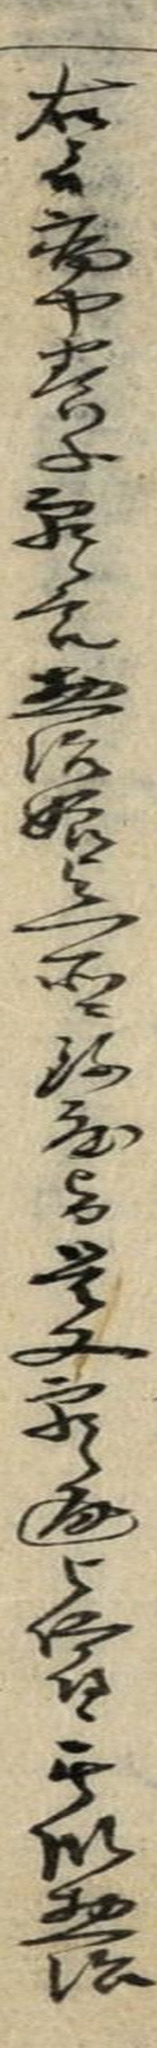右に付病中養子願候節惣治始と一所に致度旨是又願之通被仰付候其段惣治
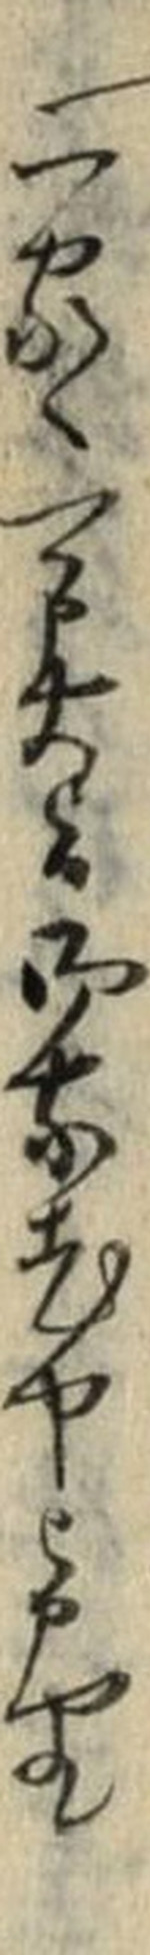一家へ可申聞旨御家老中被申聞候
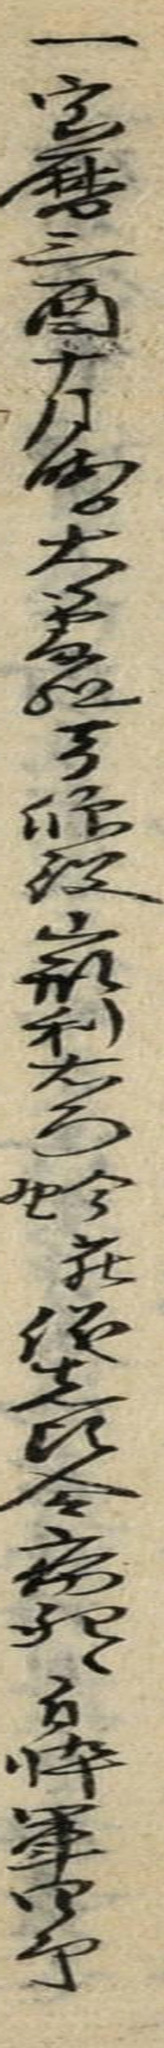一宝暦三酉十月晦日大御番組弓師役山形利右衛門今荻野儀先頃令病死候に付忰軍四郎
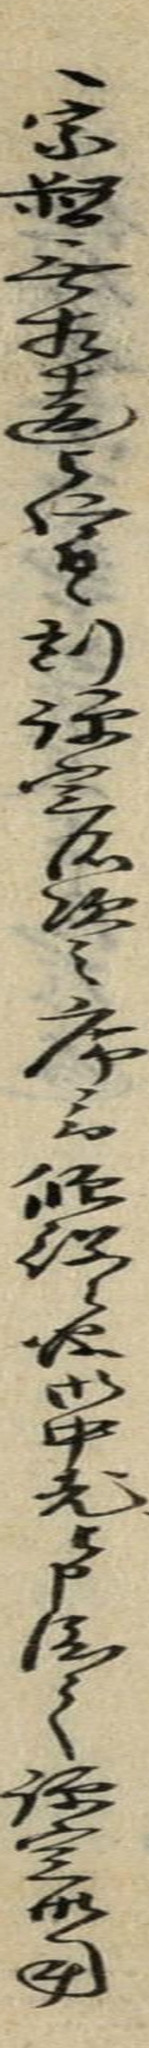へ家督無相違被仰付候刻評定所次之席に而師役之儀御中老被申渡之評定御用
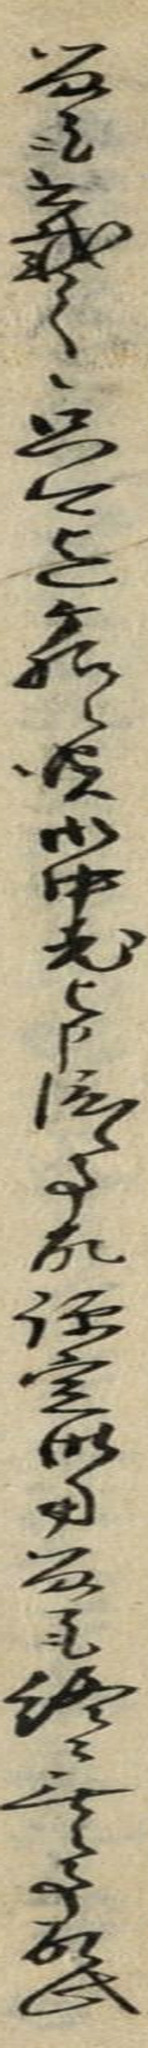留にも書載之候只今迄ケ様之儀は御中老被申渡候事故評定御用にも終に無事故此
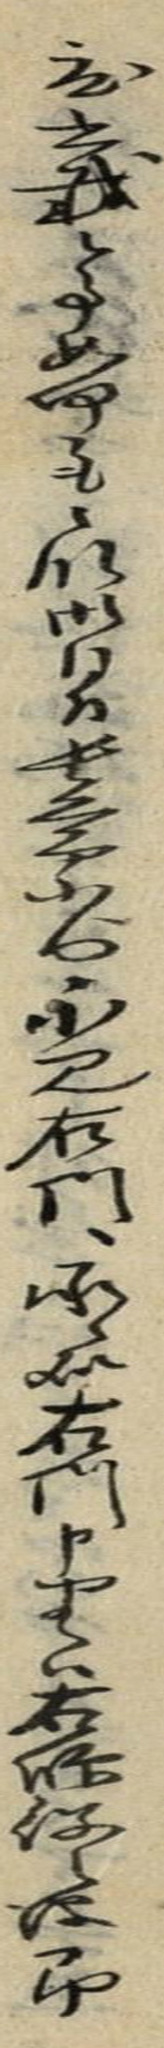度書載候事如何にも候段御目付長谷部小右衛門永見右門へ承候処右門申聞候は右師役之儀即
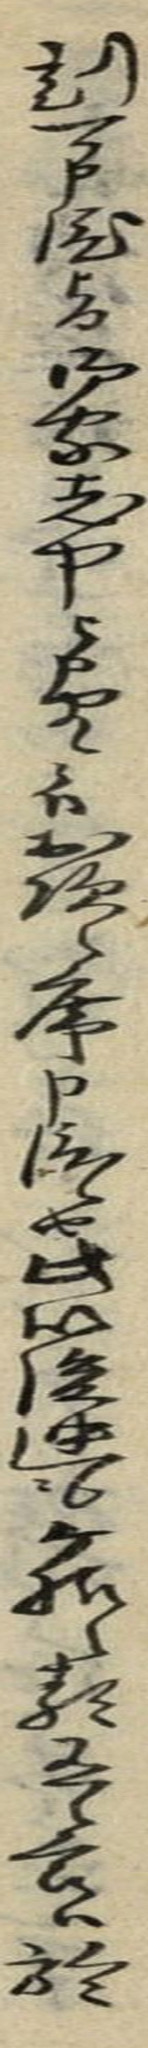刻可申渡旨御家老中被申聞候に付於次之席申渡候由此以後迚もケ様之類有之節は於
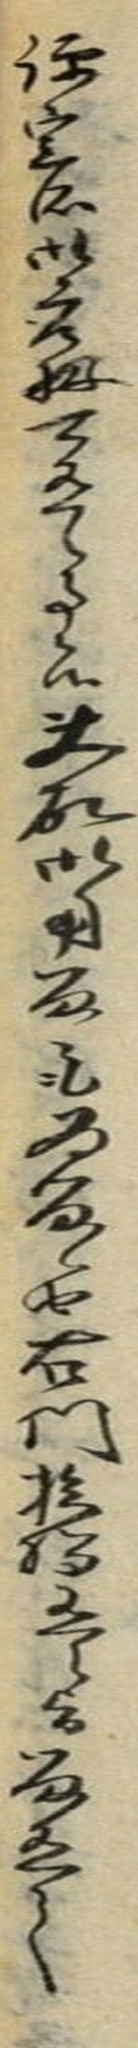評定所御取扱可有之候事に候夫故御用留にも為留候由右門挨拶有之旨留有之
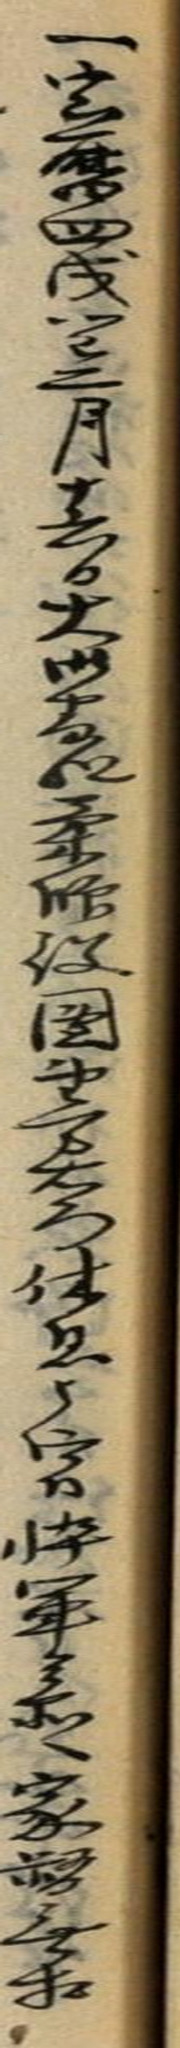一宝暦四戌閏三月十六日大御番組柔師役団野万右衛門休息被仰付忰軍兵衛へ家督無相
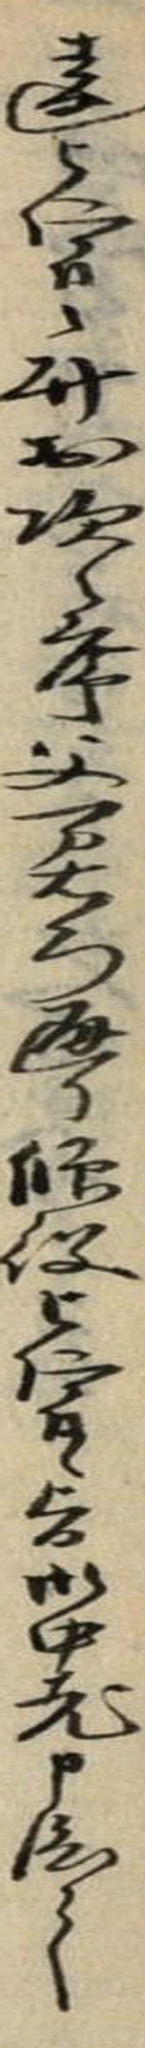違被仰付候斉於次之席父万右衛門通り師役被仰付候旨御中老申渡之
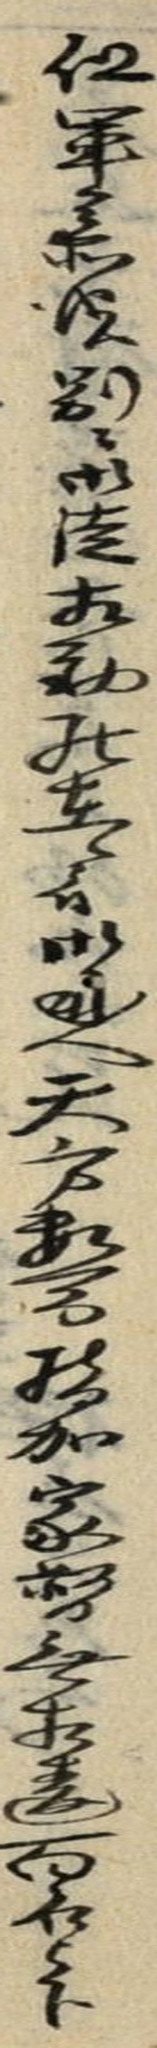但軍兵衛儀は別に御徒相勤罷在候に付御用人天方数馬指加家督無相違百石被下
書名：御用并被仰出之部
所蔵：福井県文書館 Fukui Prefectural Archives
